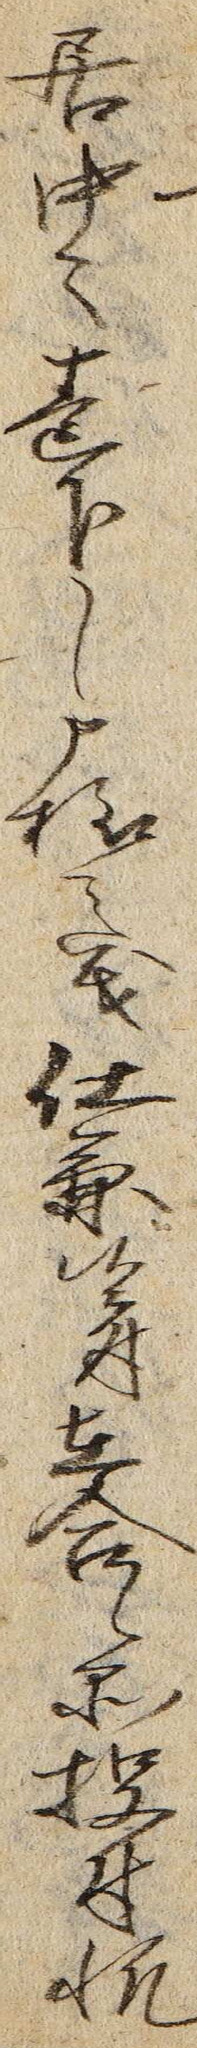居中々巻下し申様の義仕兼候に付在合の品投付帆
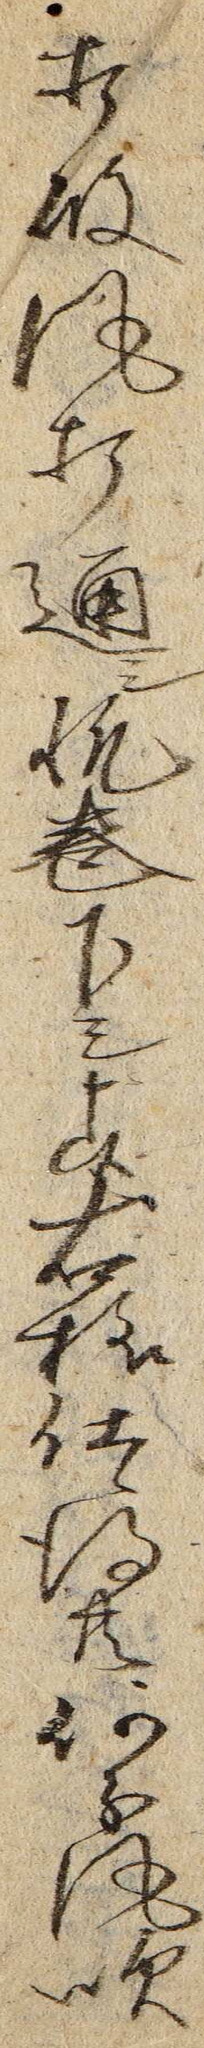打破風打通シ帆巻下シ申候右様仕候得ども何分風吹

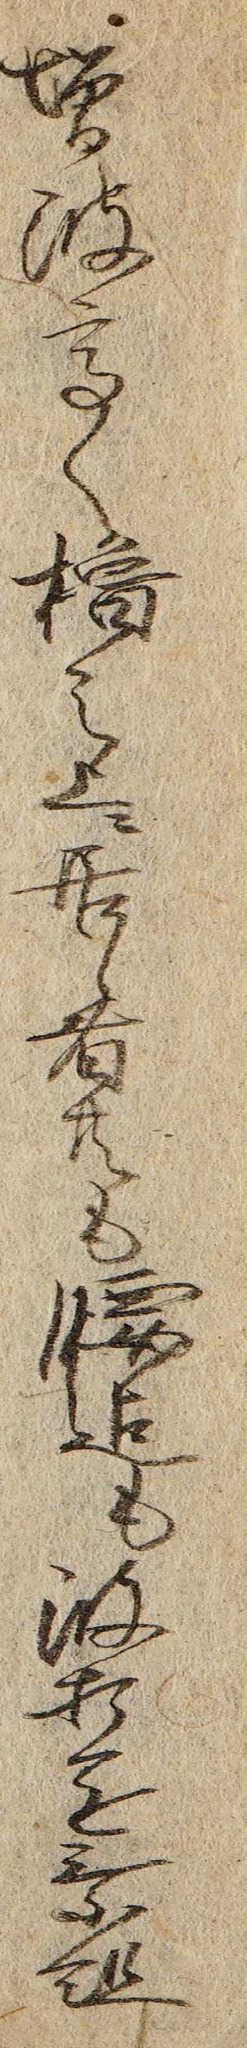増波高く櫓の上に居し者どもも腰までも波打懸乗組
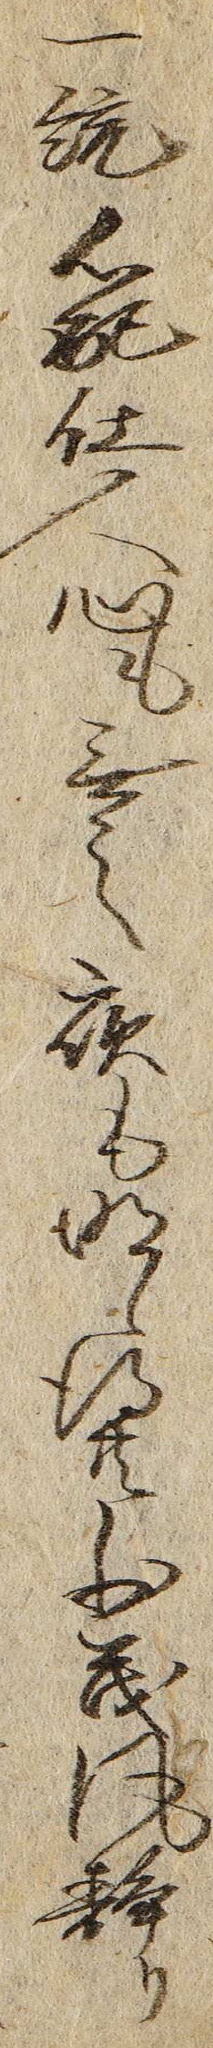一統心配仕人心も無之夜も明候得ども少も風静り
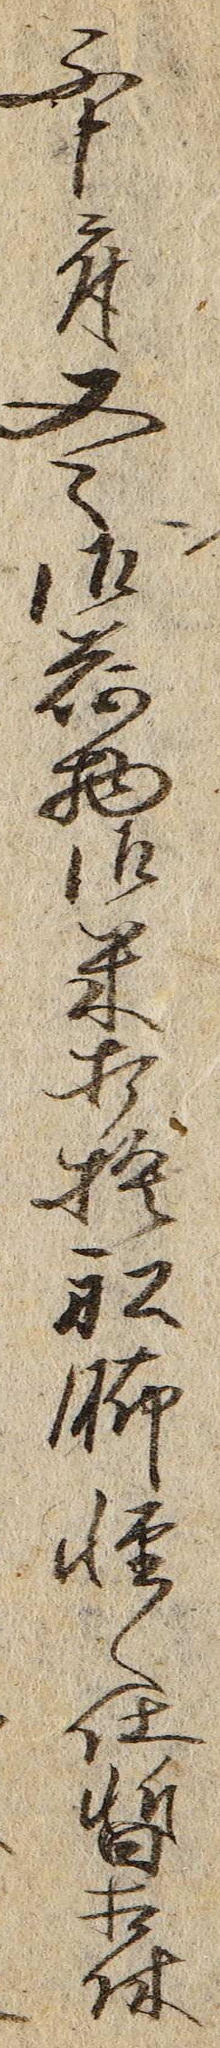不申に付又々御荷物御米打捨船脚軽く仕暫相休
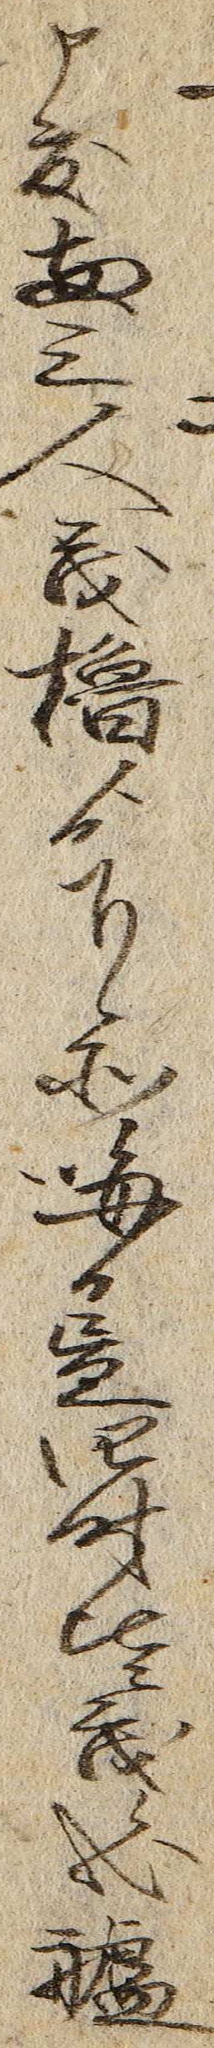申度両三人も櫓より下候所晦日昼四時頃にも候哉艫
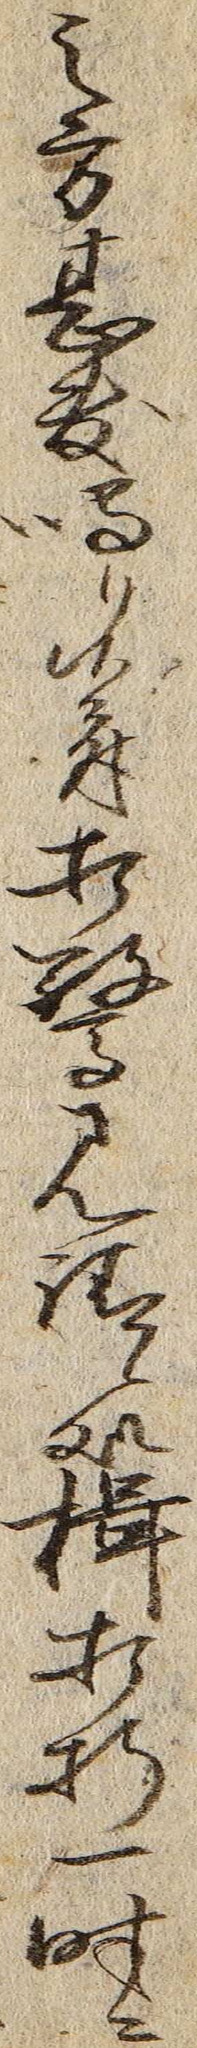の方甚しく鳴り候に付打驚見請候処楫打折一時に
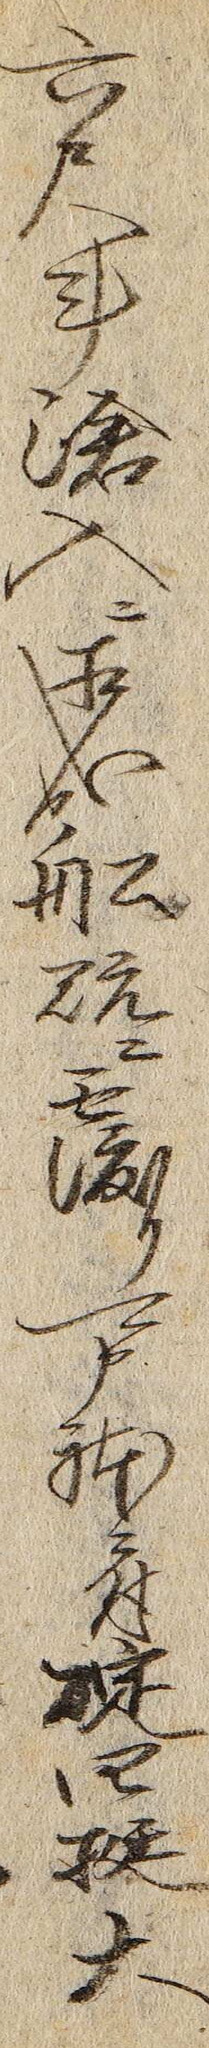六尺斗滄入に相成船既に覆り可申体に付碇四挺大
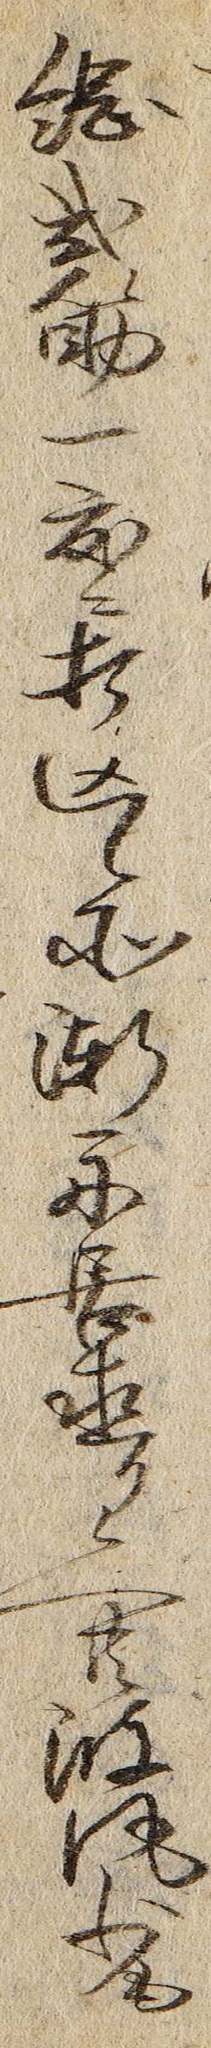綱二筋一度に打込候所漸舟居直り候へども波風少も
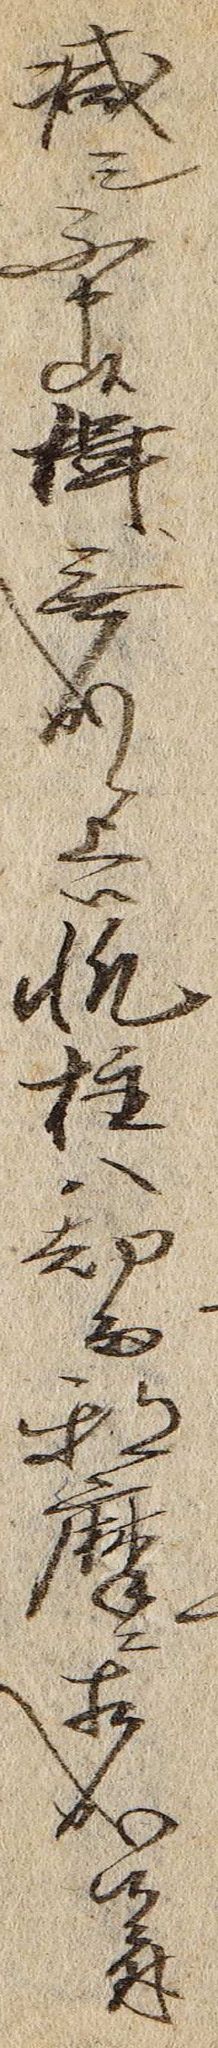減シ不申候楫無成候上は帆柱は却て邪魔に相成候に付
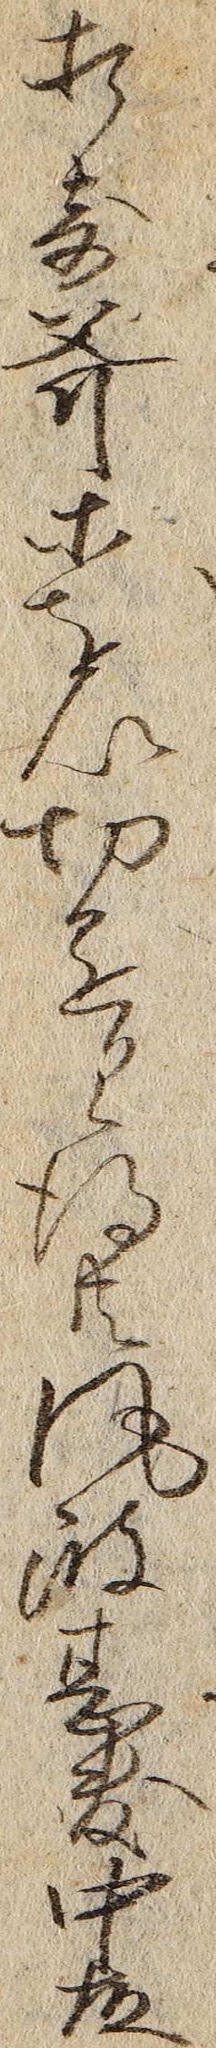打寄斧等を以切懸り候得ども風波甚しき中故
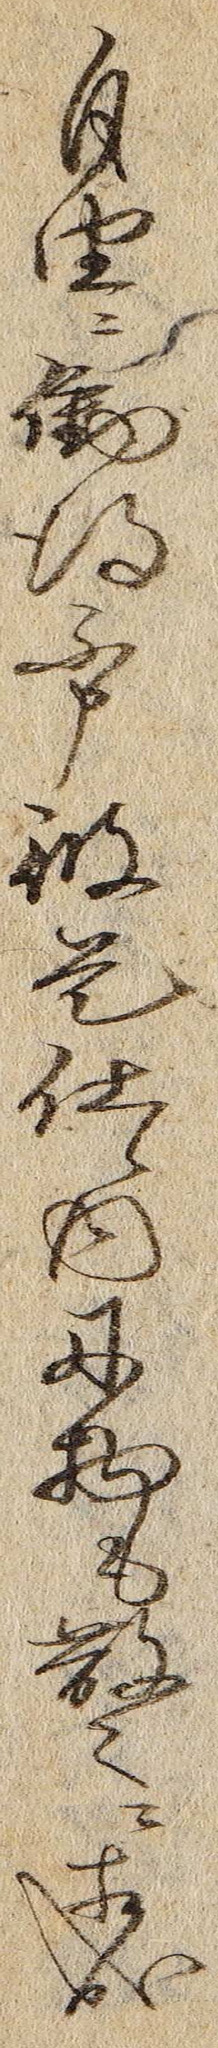自由に働得不申彼是仕候内に物も散々に相成
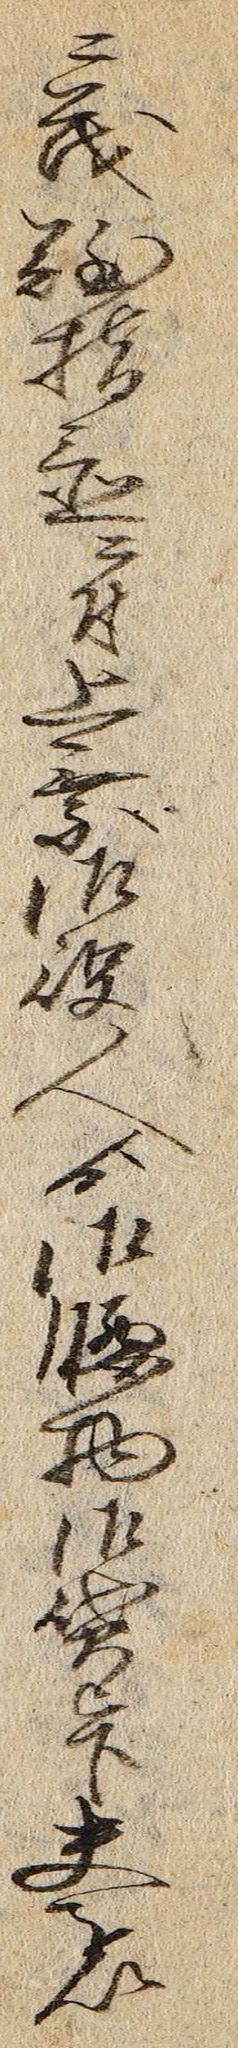にも難指置に付上乗御役人より御腰物御貸被下夫を以
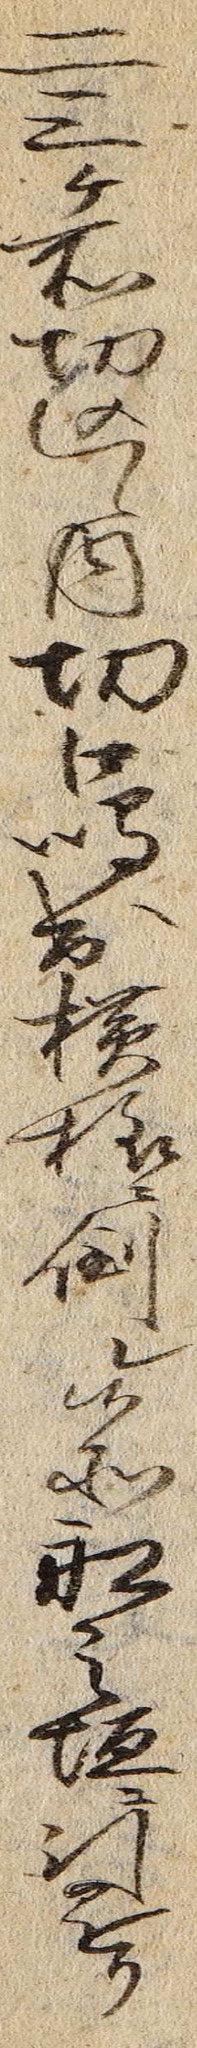二三ケ所切込候内切口鳴出横様に倒レ候所船の垣に引懸り
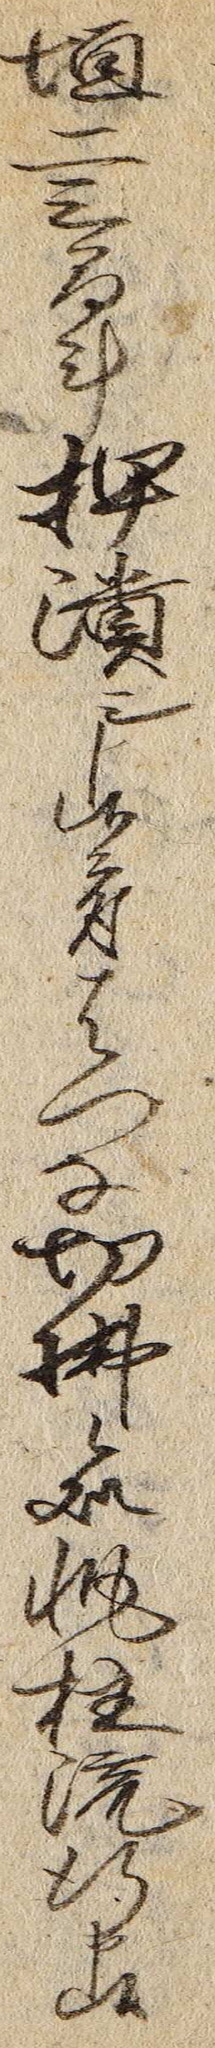垣二三間斗押潰し申候に付はつな切払候処帆柱流行申候
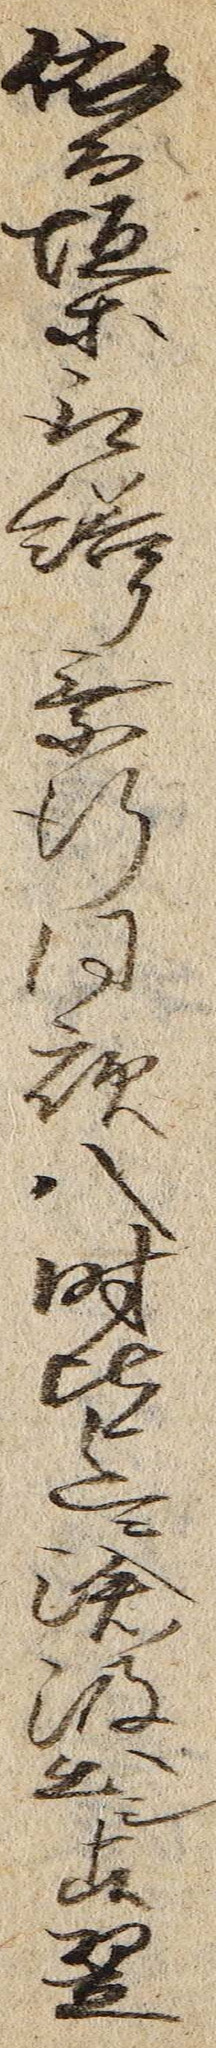依て垣等取繕り乗行同夜八時頃までに滄汲出し申候翌
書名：能登国清兵衛異国江漂流之始末
